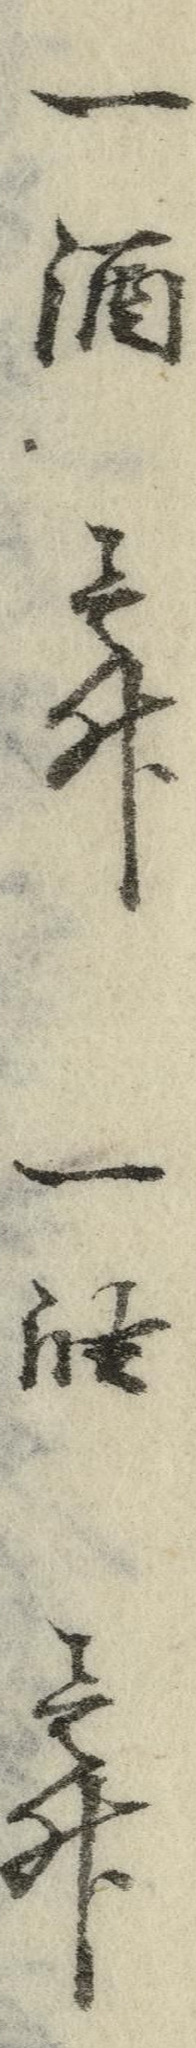一酒壱升一油壱升
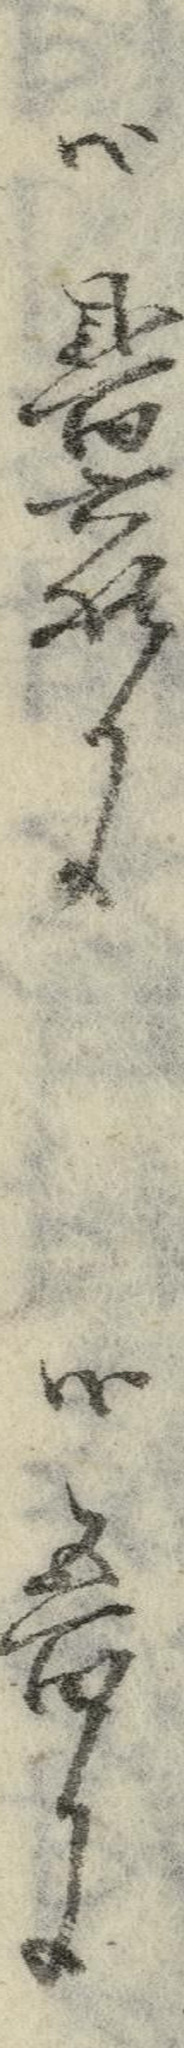同弐百六拾文同五百文
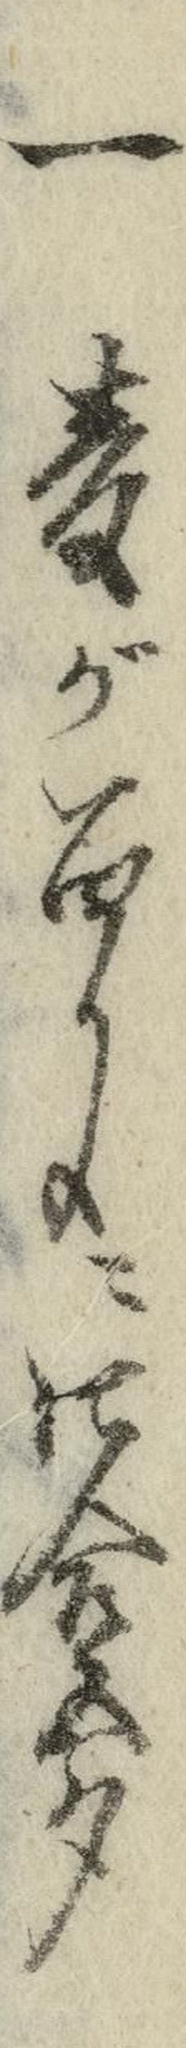一麦が百文ニ四合五勺
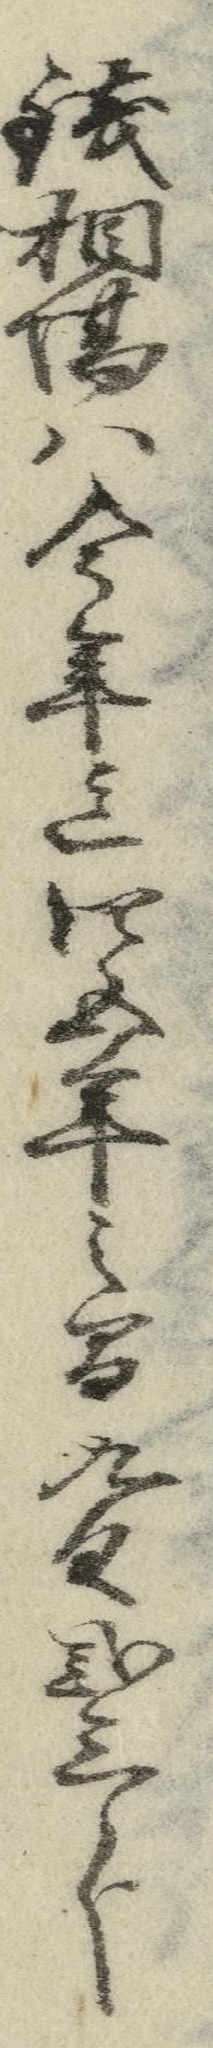銭相場ハ今年迄四五年之間九匁弐三分
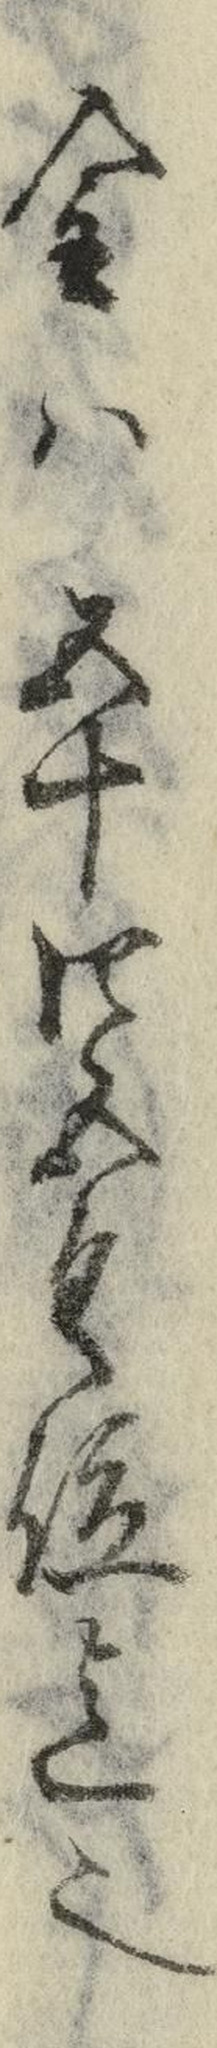金ハ五十四五匁位迄也
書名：信州浅間山焼
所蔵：東京大学地震研究所図書室 Earthquake Research Institute Library, The University of Tokyo, JAPAN
